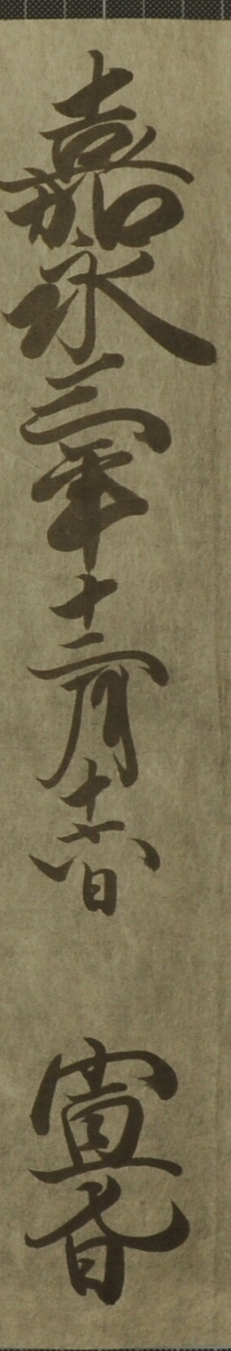嘉永三年十二月十六日宣旨
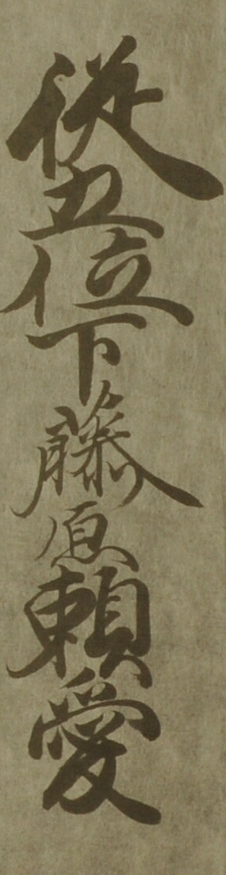従五位下藤原頼愛
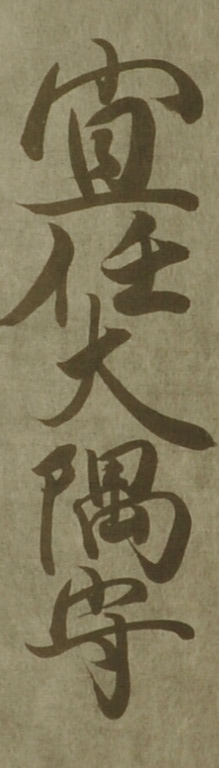宜任大隅守

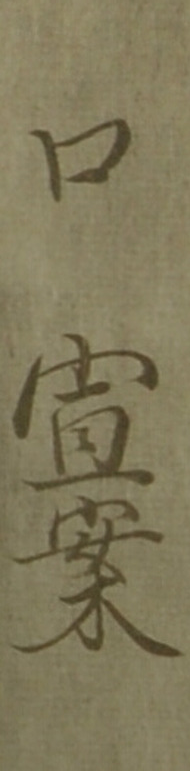口宣案

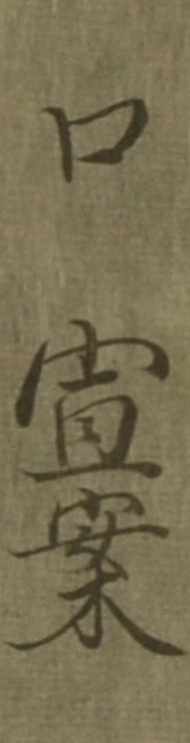口宣案
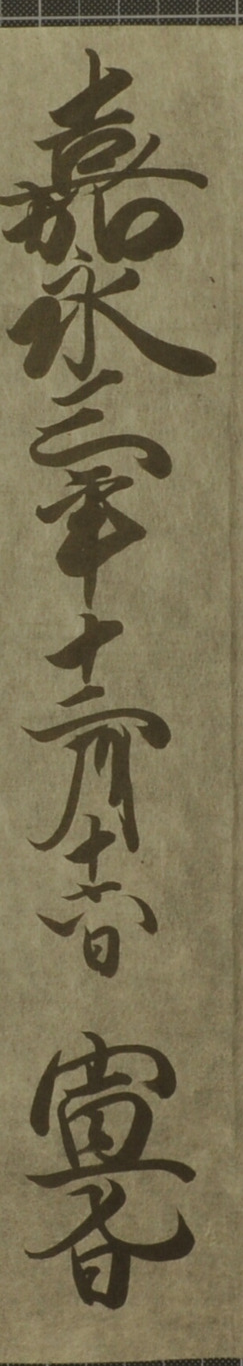嘉永三年十二月十六日宣旨
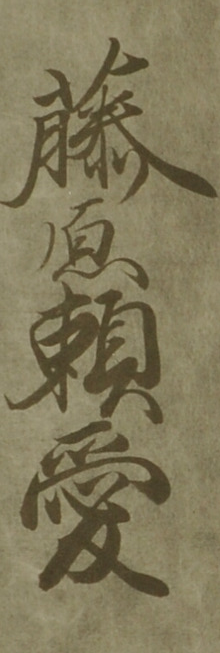藤原頼愛
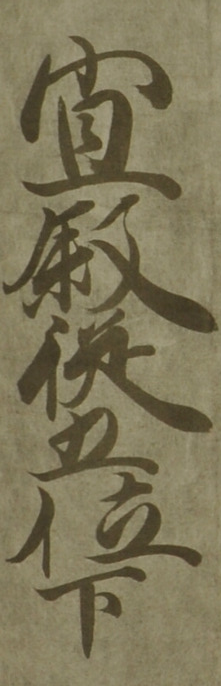宜叙従五位下
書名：口宣案・宣旨・位記
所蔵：伊那市立高遠町図書館・合同会社AMANE
